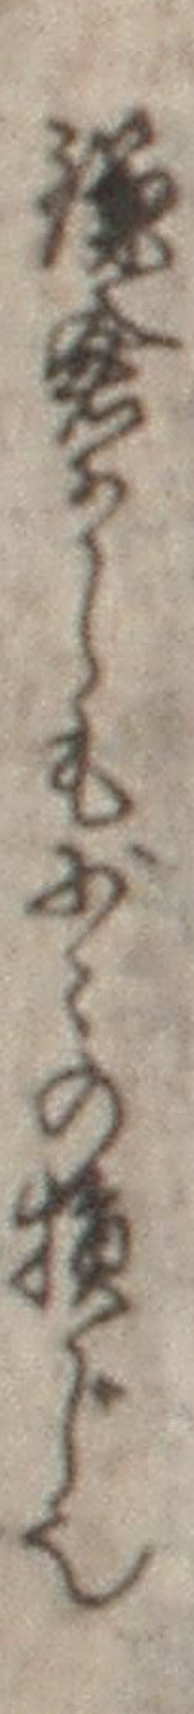鎌倉かしも少〻の損じ也
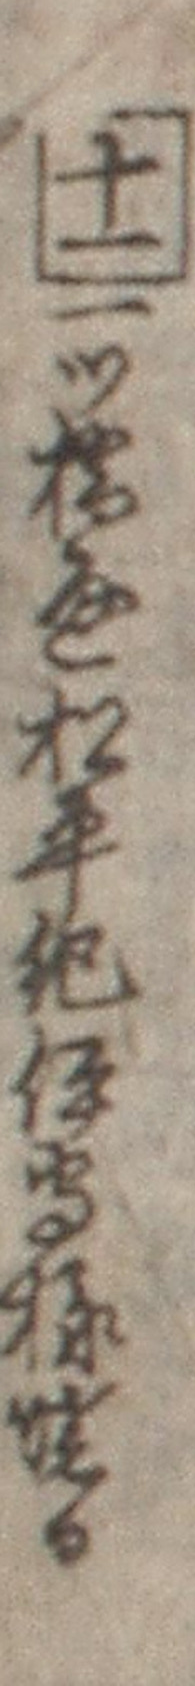十一一ツ橋通松平紀伊守様焼る

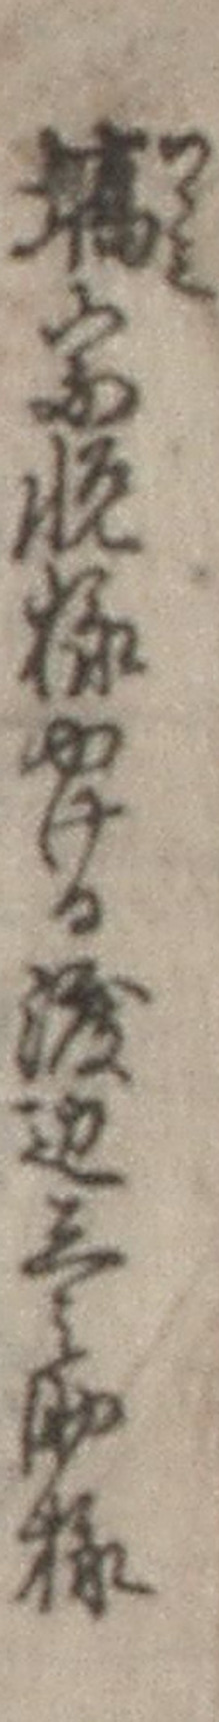-塙宗悦様やける渡辺三之助様
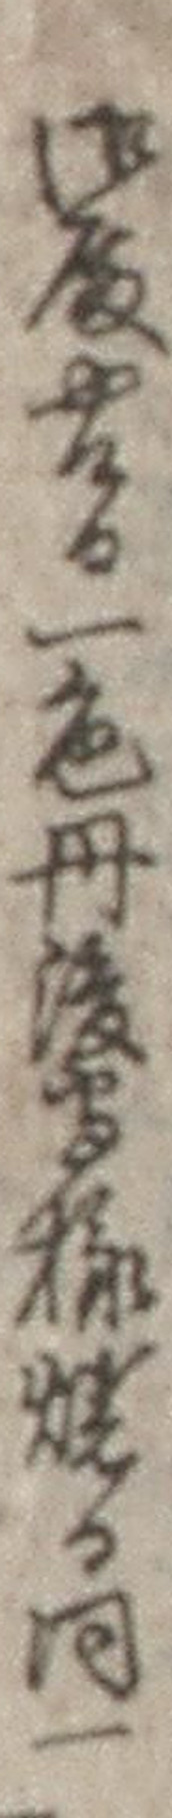御殿やける一色丹後守様焼る同一
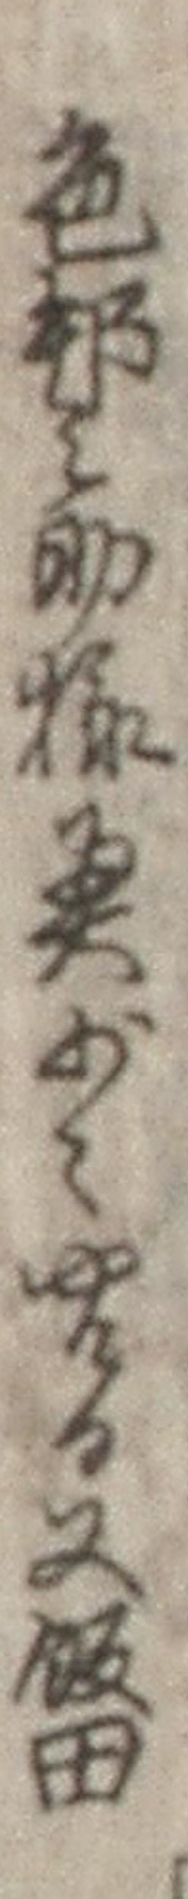色邦之助様奥少〻やける又飯田
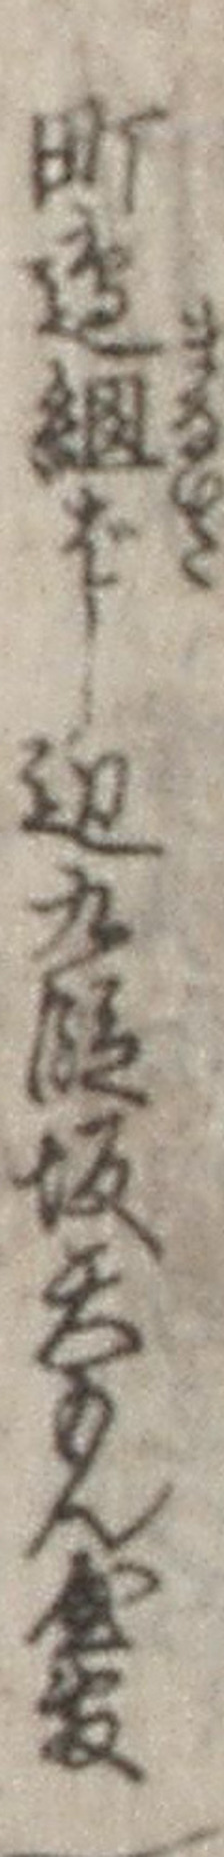町邊-組ばし辺九段坂天もん屋敷
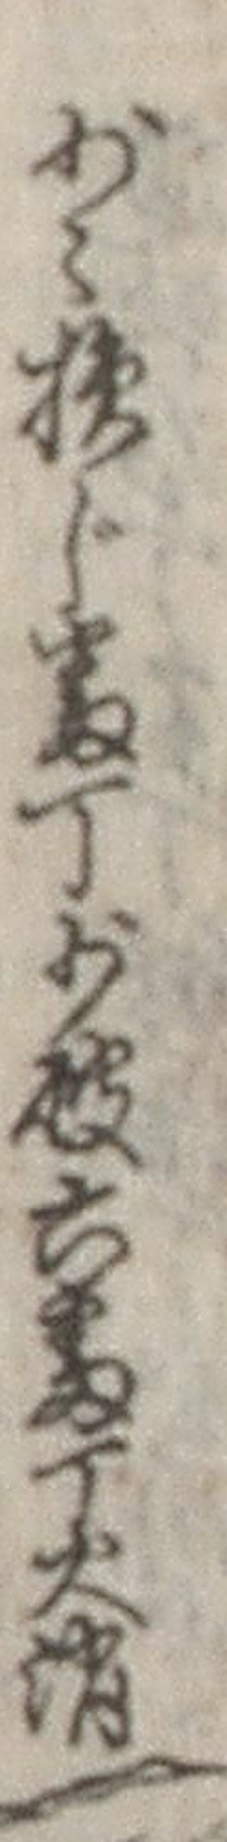少〻損じ嶌丁少破六番丁火消
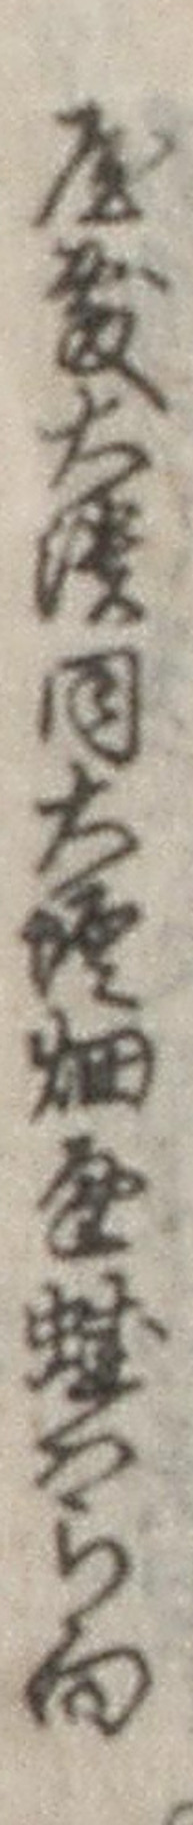家敷大潰同大堙畑通蛭はら向
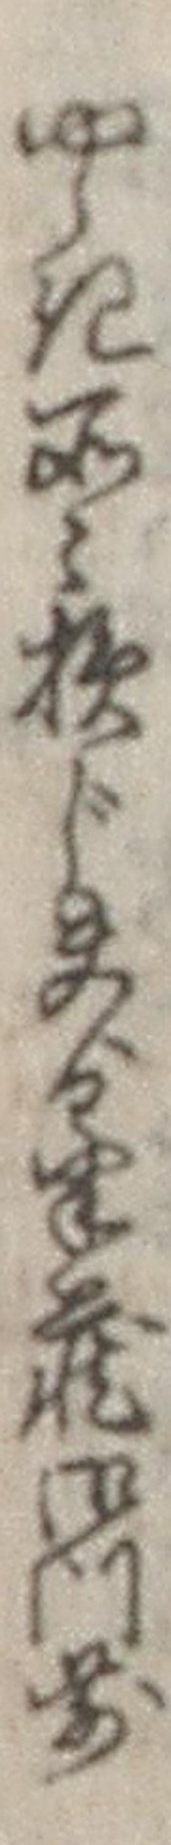やしき所〻損じ夫ゟ半蔵御門前
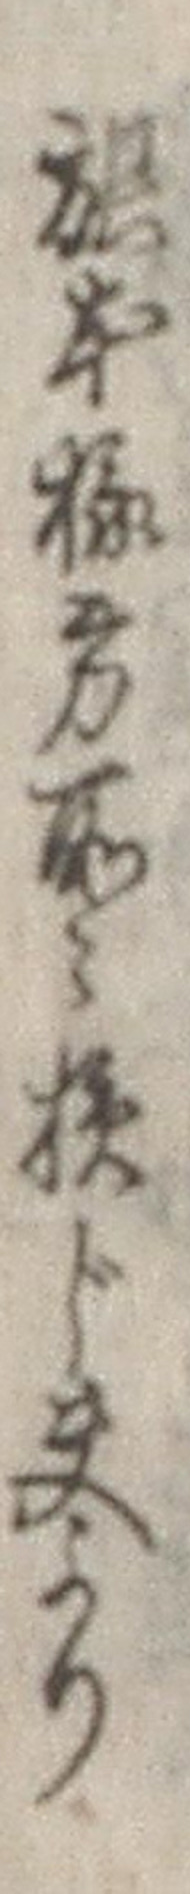旗本様方所〻損じ夫より
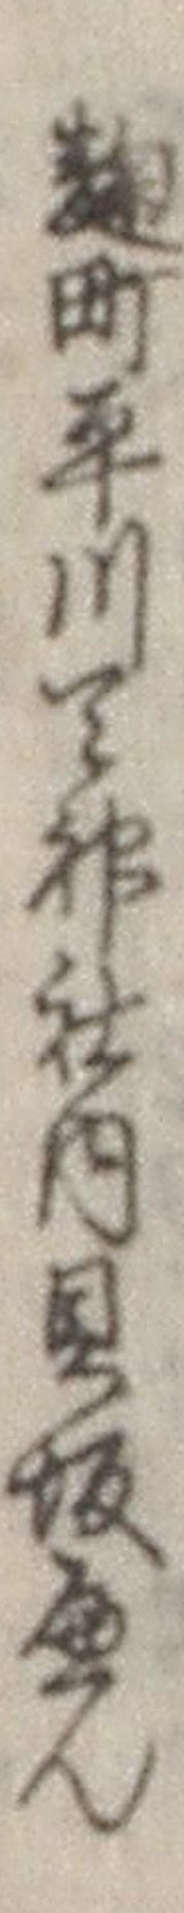麹町平川天神社内貝坂遍ん
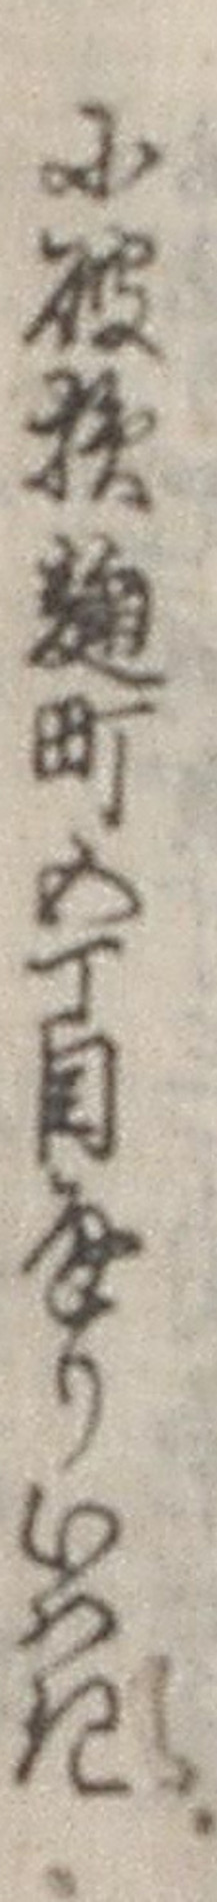小破損麹町五丁目遍りいはき
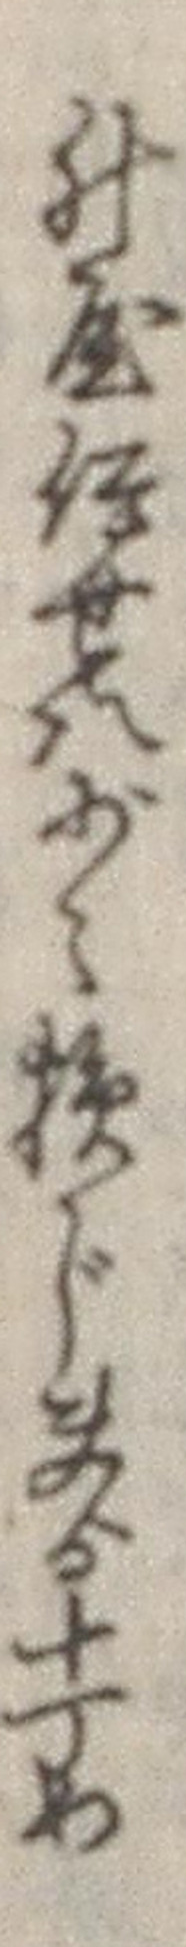升屋伊せ八少〻損じ夫ゟ十丁め
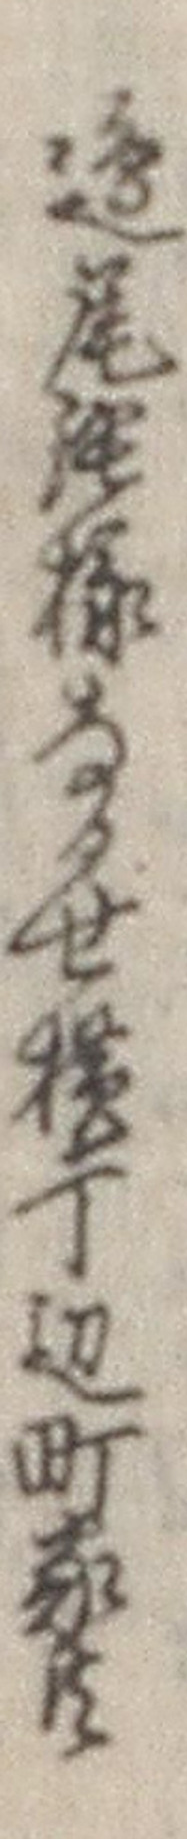邊尾張様なるせ横丁辺町家者
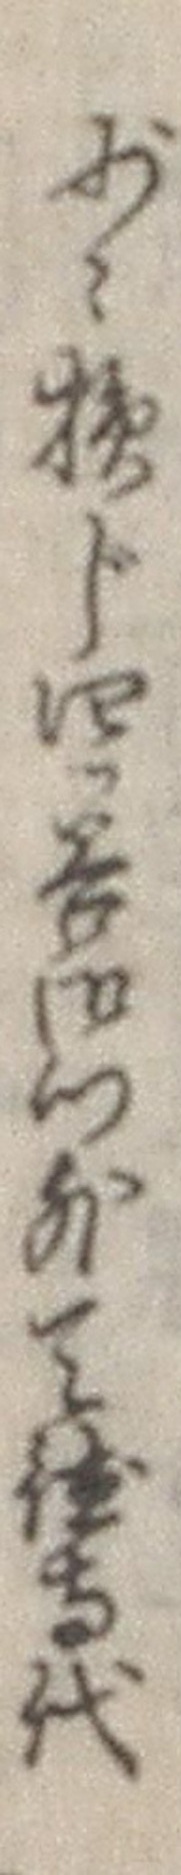少〻損じ四ツ谷御門外天徳寺代
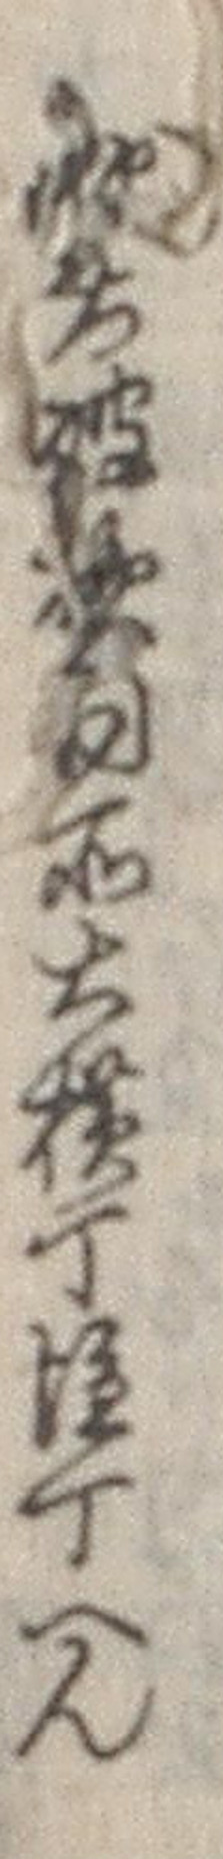大破損同所大横丁撞丁へん
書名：江戸　大地震臣細録　全
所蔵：東京大学地震研究所図書室 Earthquake Research Institute Library, The University of Tokyo, JAPAN
